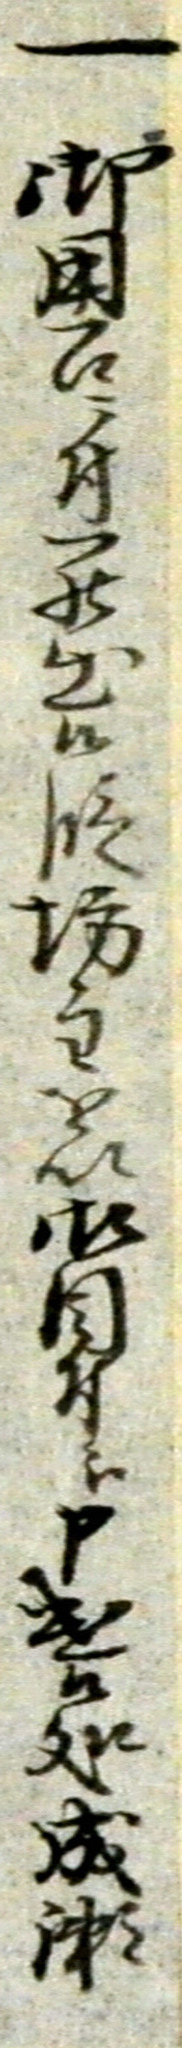一御用召ニ付罷出候段坊主を以御目付江申遣候処成瀬
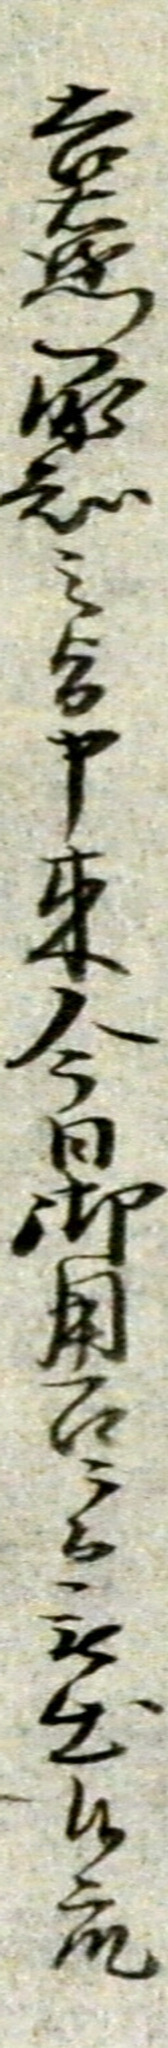吉右衛門承知之旨申来今日御用召ニ而被出候衆
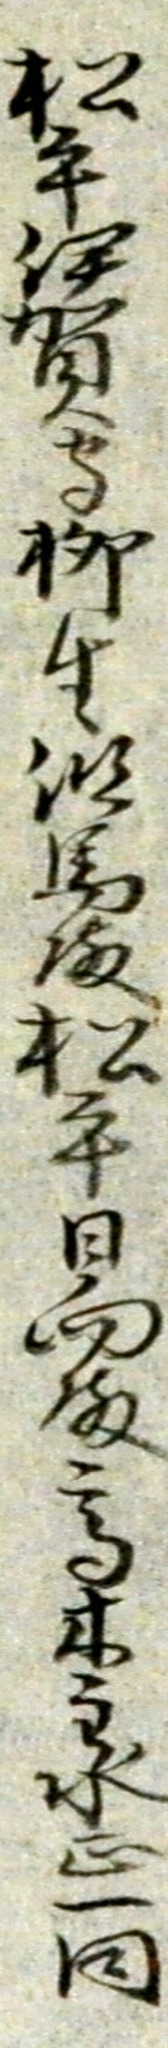松平伊賀守柳生但馬殿松平日向殿高木主水正一同
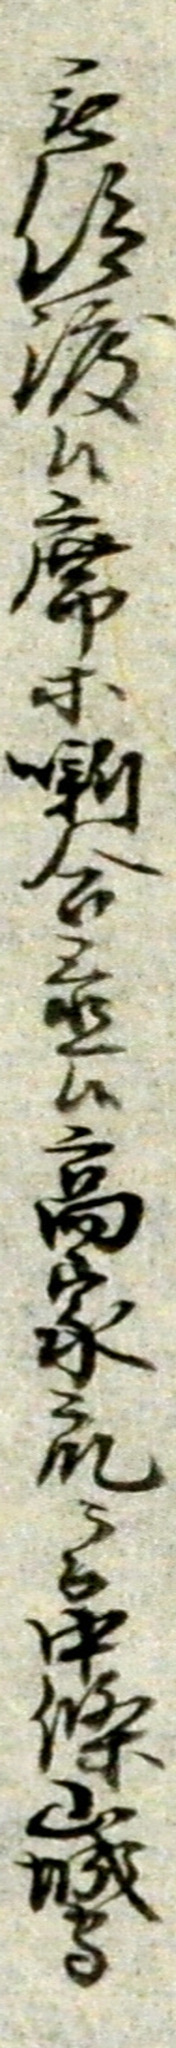被仰渡候席等噺合置候高家衆ニ而中條山城守
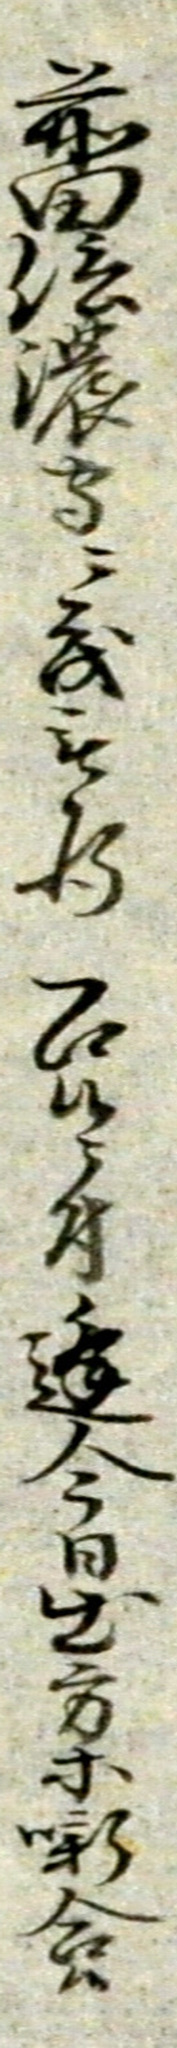前田信濃守ニも被為召候ニ付逢今日出方等噺合候
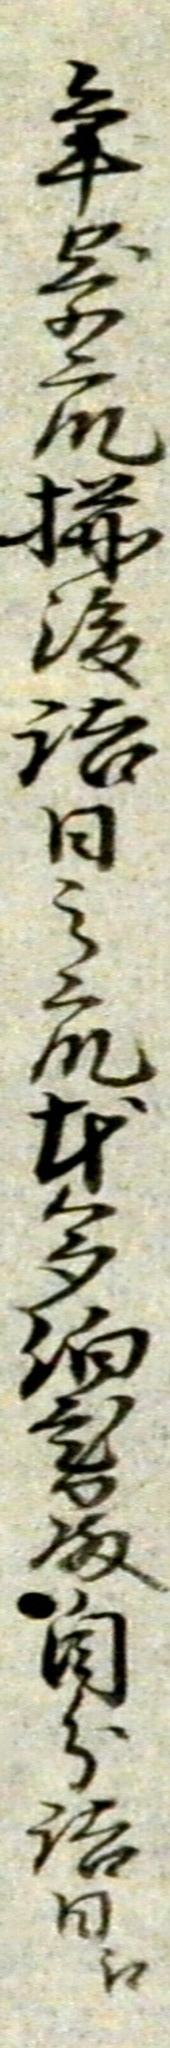年寄衆揃後詰日之衆本多伯耆守殿自分詰日江
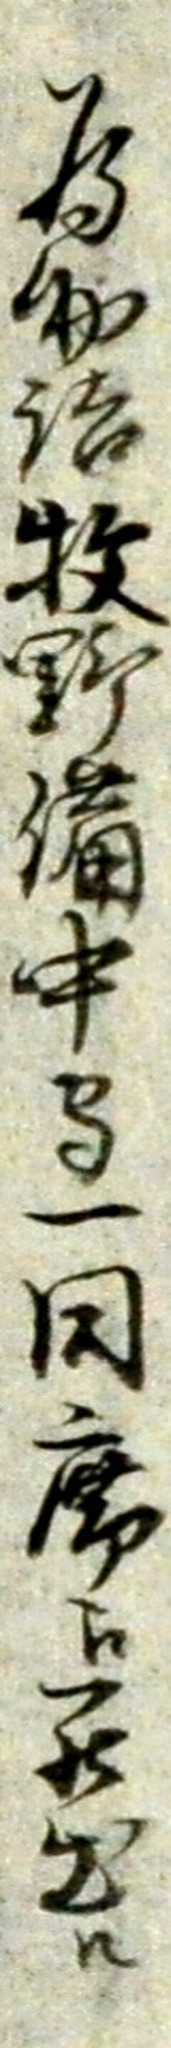為助詰牧野備中守一同席江罷出ル
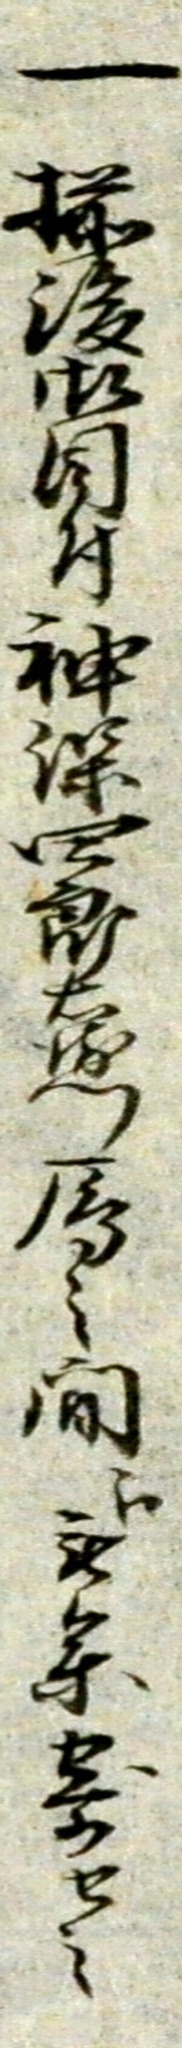一揃後御目付神保四郎右衛門雁之間江被参寄せ之
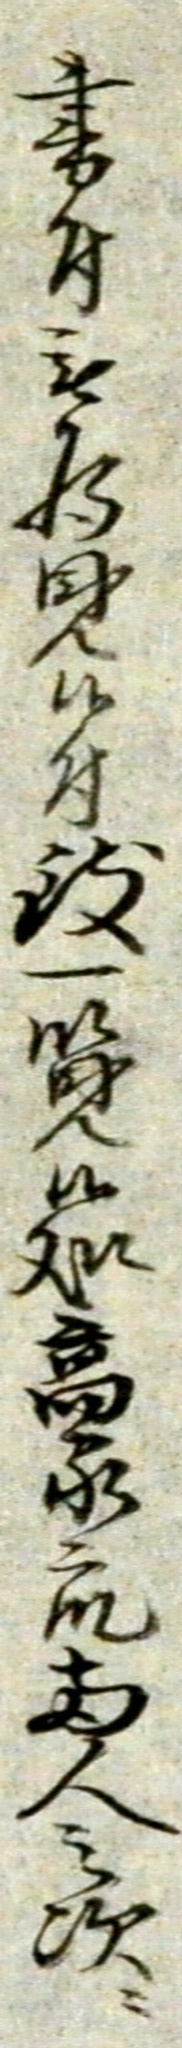書付被為見候付致一覧候処高家衆両人之次ニ
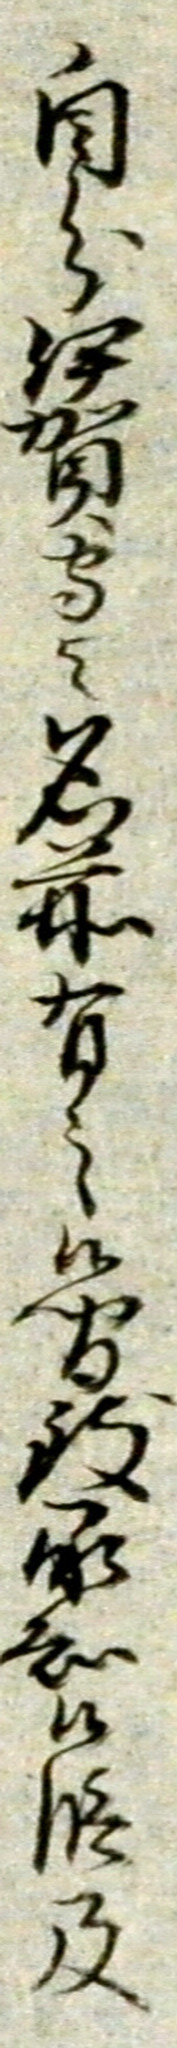自分伊賀守と名前有之候間致承知候段及
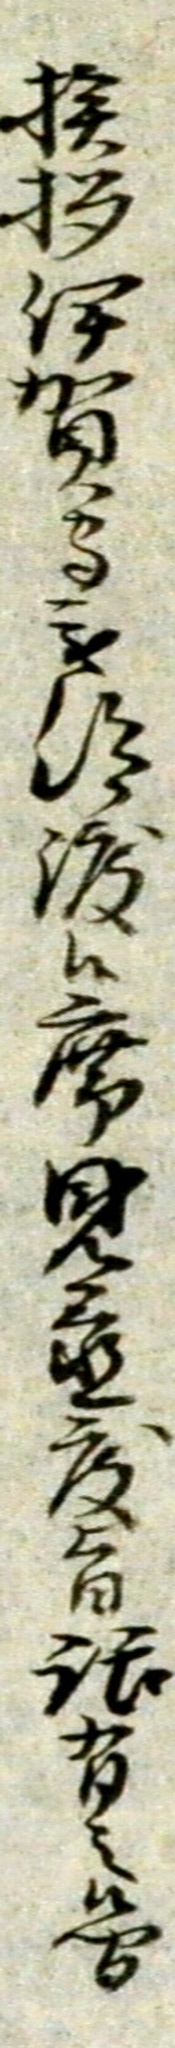挨拶伊賀守被仰渡候席見置度旨話有之候間
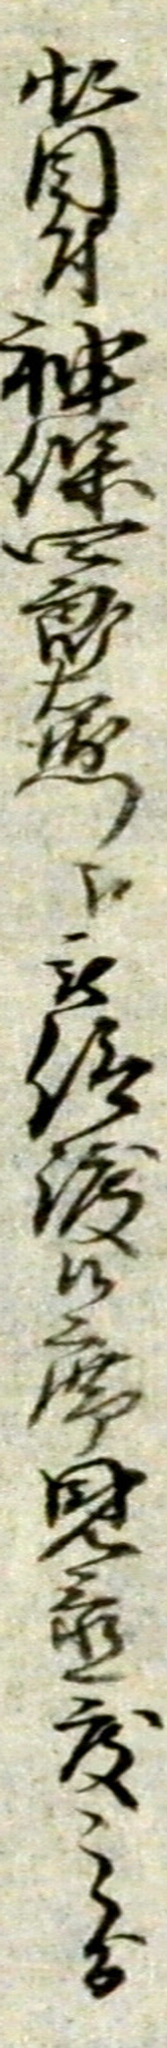御目付神保四郎右衛門江被仰渡候席見置度之分
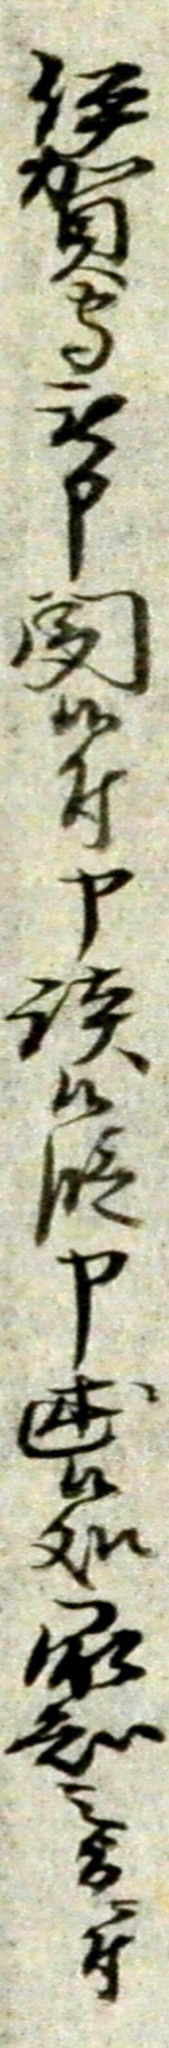伊賀守被申聞候付申談候段申述候処承知之旨ニ付
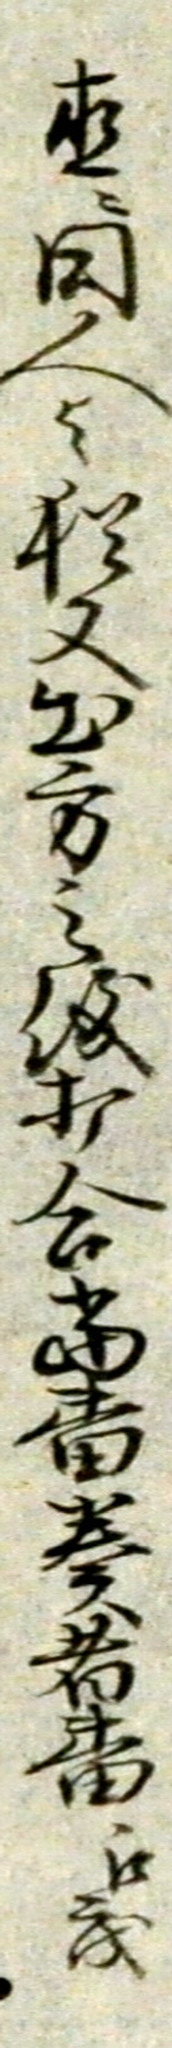直ニ同人と猶又出方之儀打合当番奏者番江も
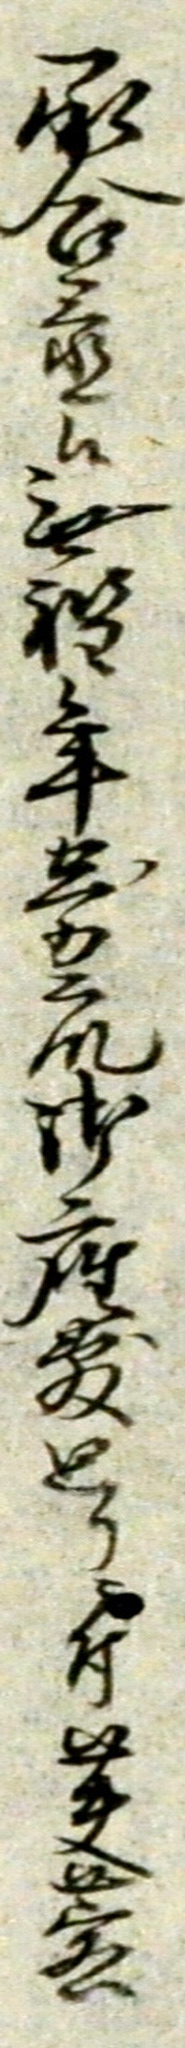承合置候無程年寄衆御座敷廻りニ付芙蓉
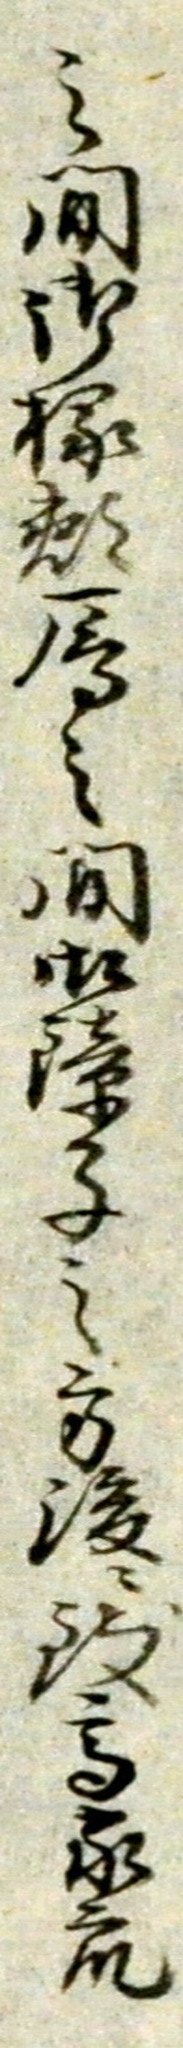之間御縁頬雁之間御障子之方後ニ致高家衆
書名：日光御名代相勤候節ノ留
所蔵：伊那市立高遠町図書館・合同会社AMANE
